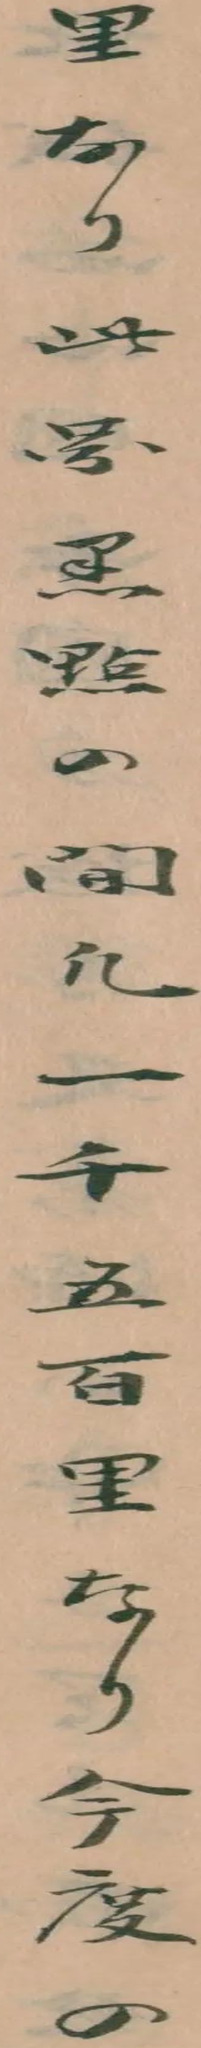里なり此図黒点の間凡一千五百里なり今度の
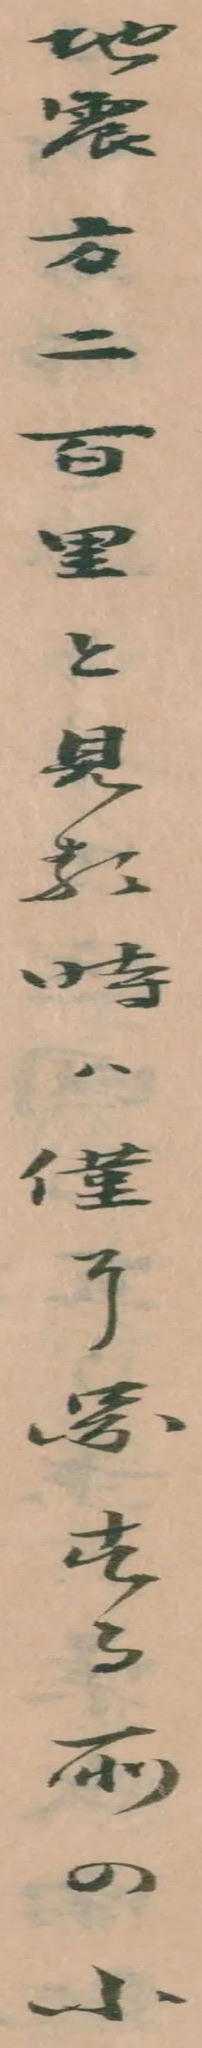地震方二百里と見る時は僅に図する所の小
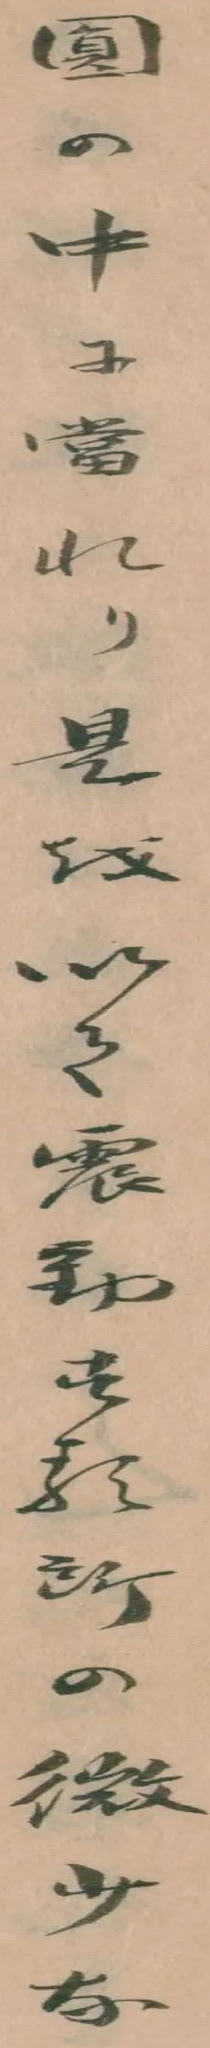円の中に当れり是を以て振動する所の微少な
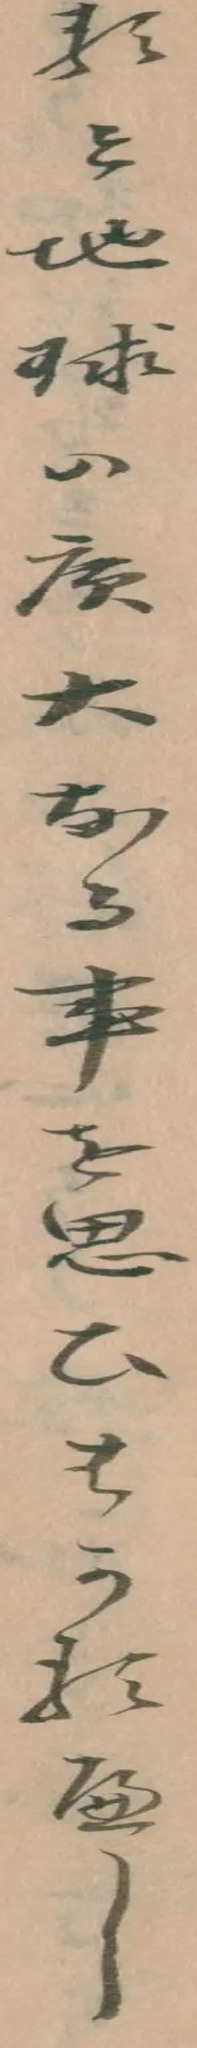ると地球の広大なる事を思ひはかるへし
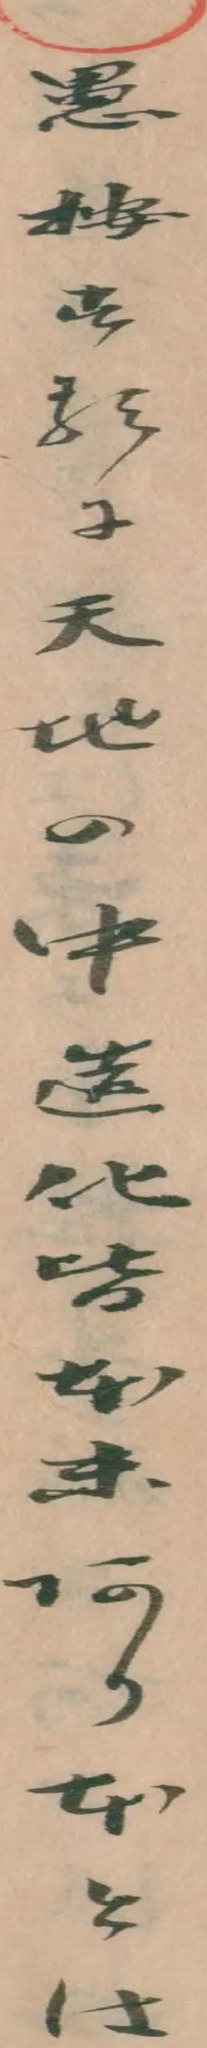〇愚按するに天地の中造化皆本末あり本とは
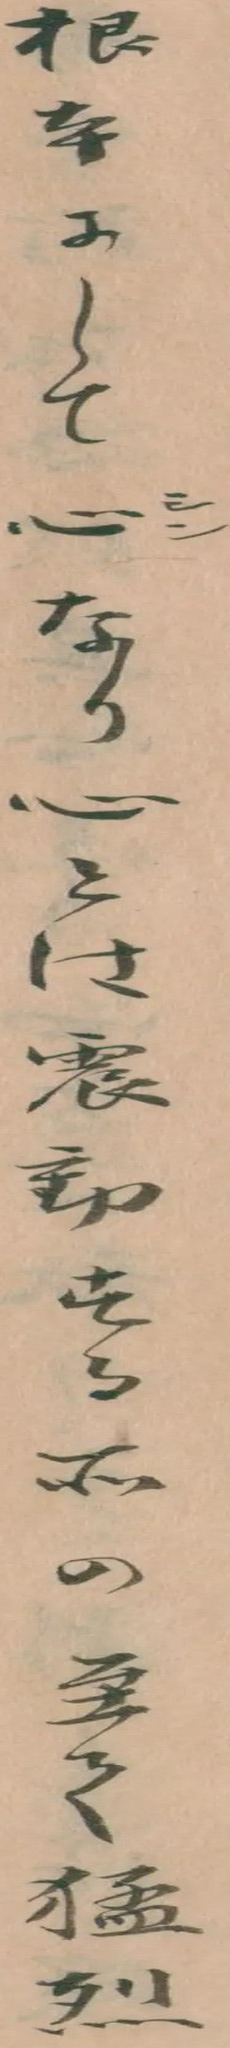根本にして心なり心とは振動する所の至て猛烈

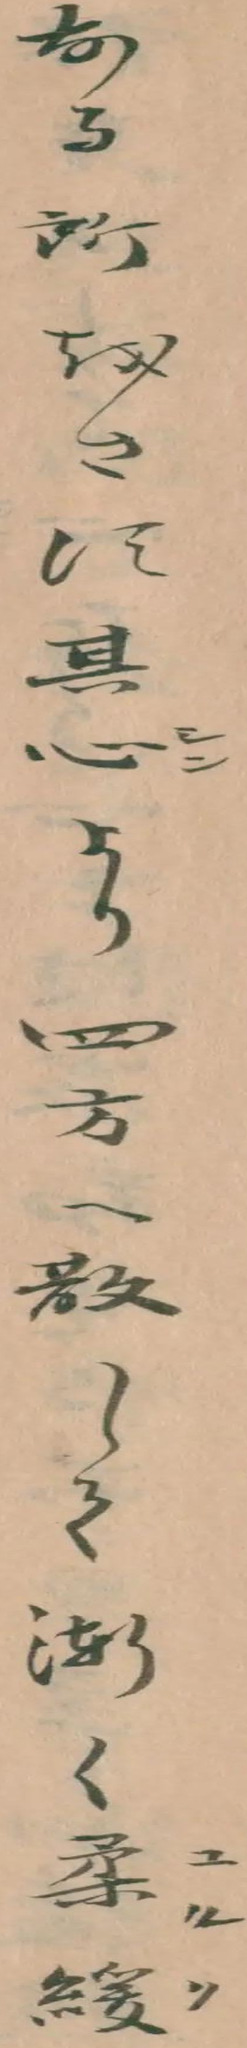なる所をさす其心より四方へ散して漸く柔緩
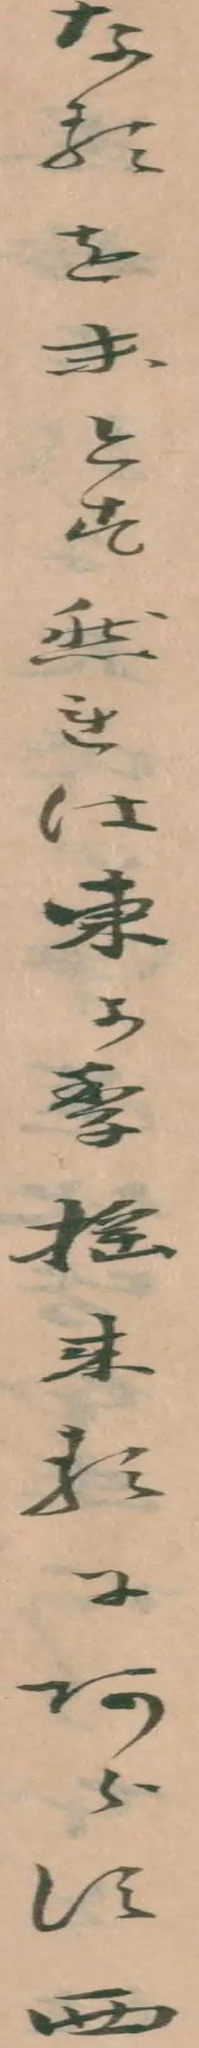なるを末とす然れは東より揺来るにあらす西
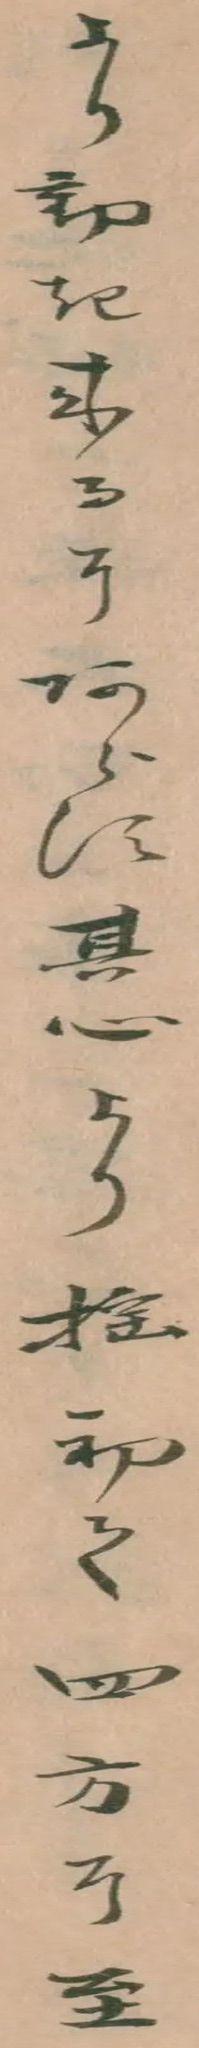より動き来るにあらす其心より揺初て四方に至
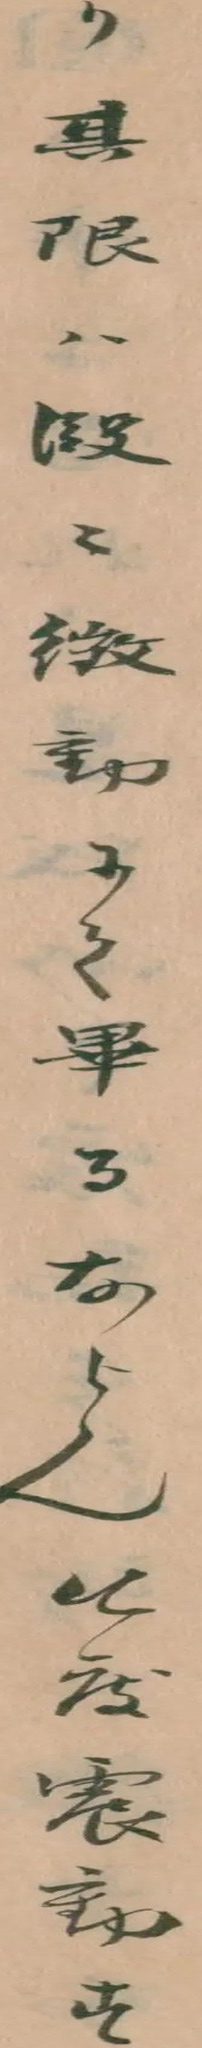り其限は段々微動にて畢るならん今度震動す
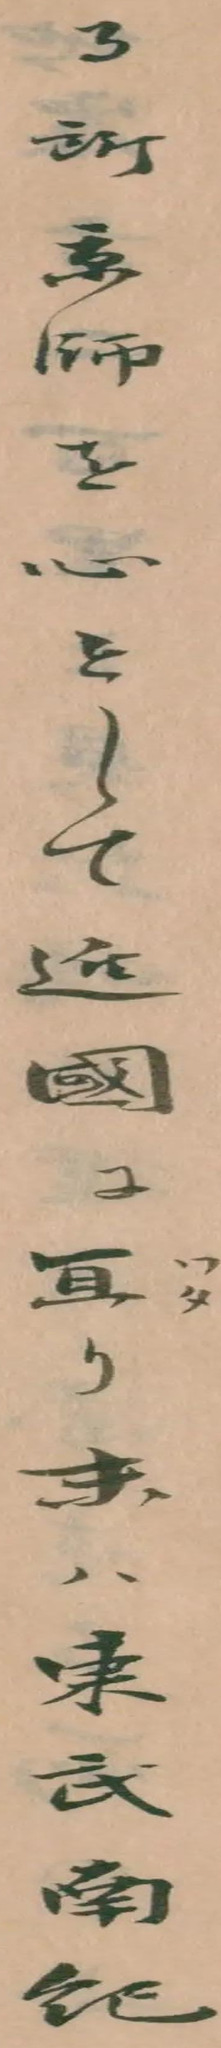る所京師を心として近国に亘り末は東武南紀
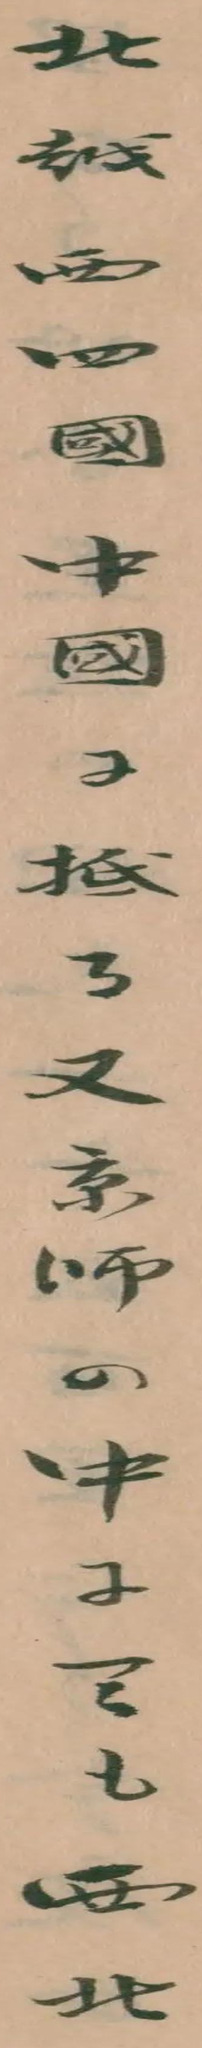北越西四国中国に抵る又京師の中にても西北
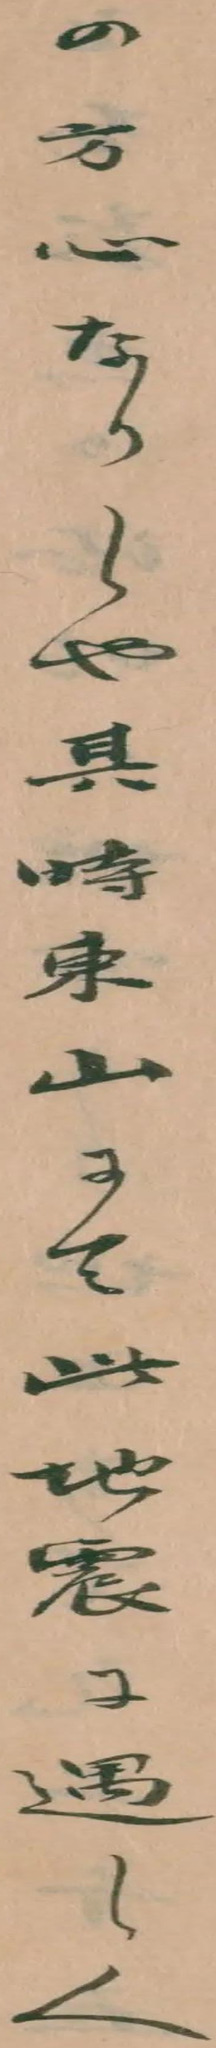の方心なりしや其時東山にて此地震に遇し人
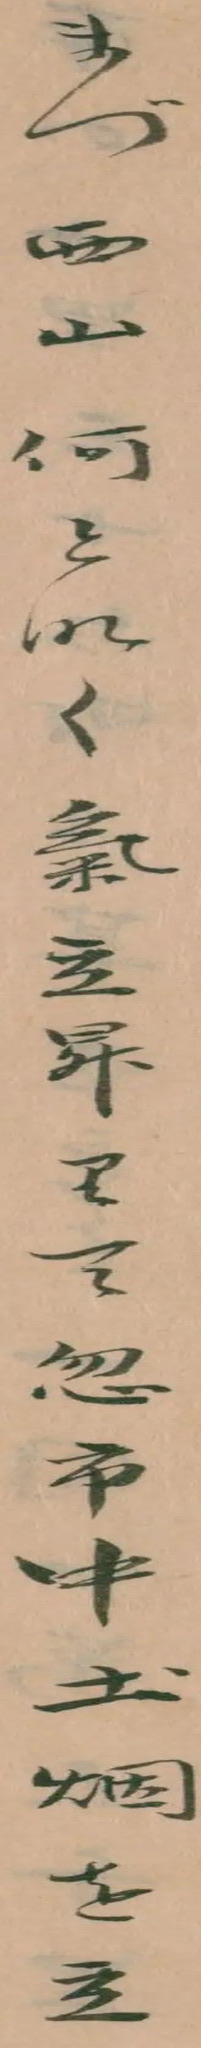まづ西山何となく気立昇りて忽市中土烟を立
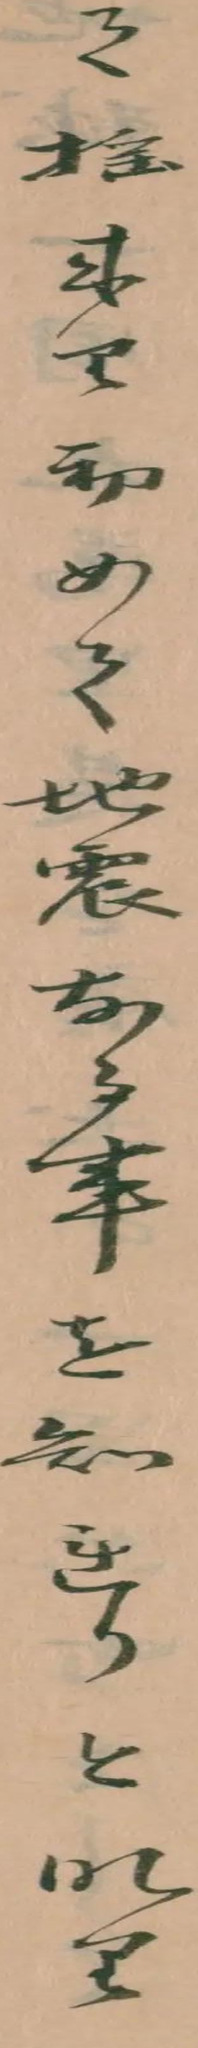て揺来り初めて地震なる事を知れりとなり
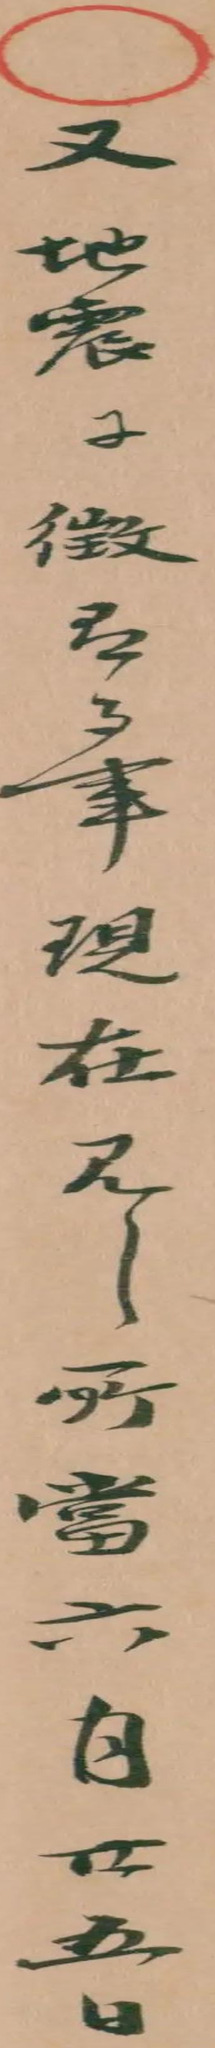〇又地震に徴有る事現在見し所当六月廿五日
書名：地災撮要. 巻5-6(地震之部)
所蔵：国立国会図書館 National Diet Library, JAPAN
